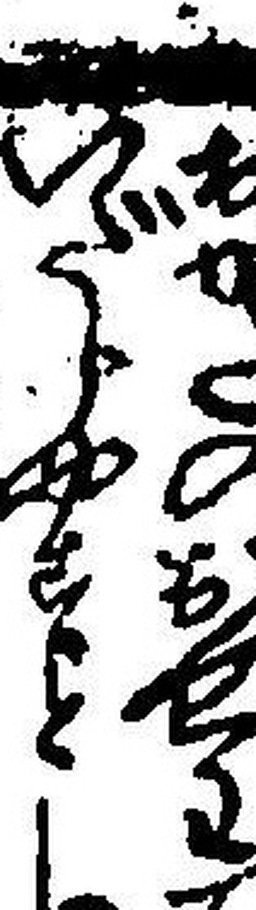いだしやすと
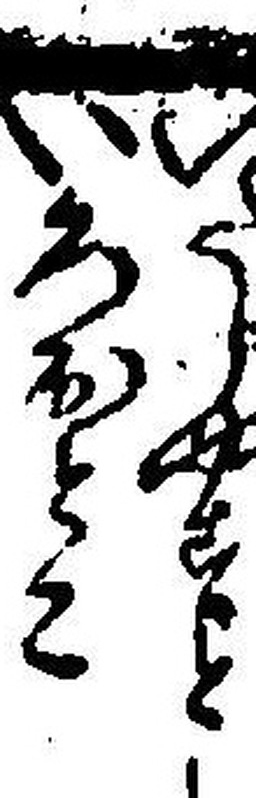いろおとこ
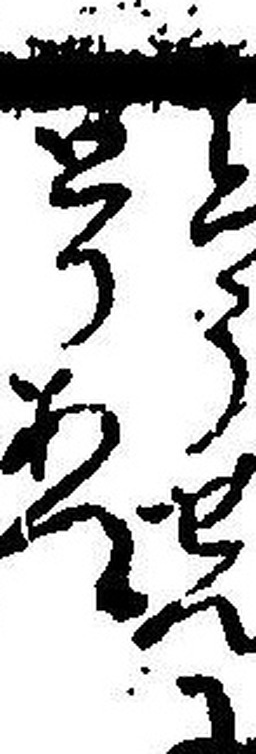とりあつ
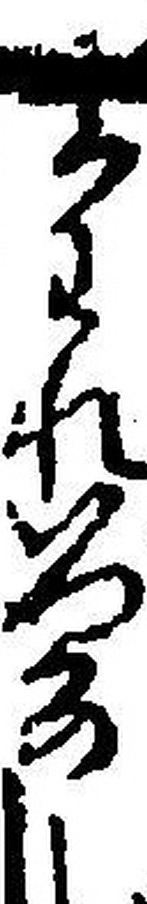かわれいつかの
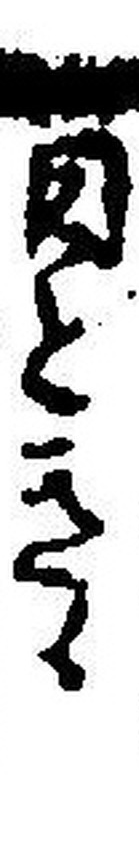日ときゝ
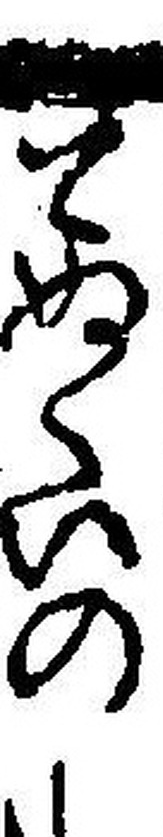てぬくいの
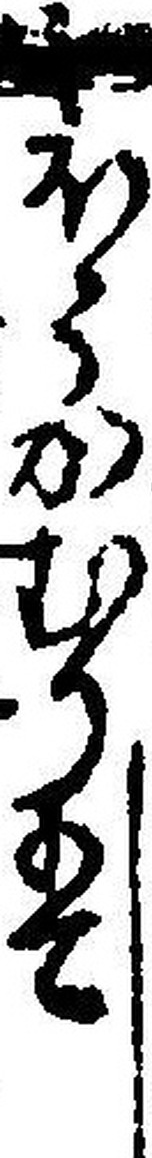ほうかむりにて
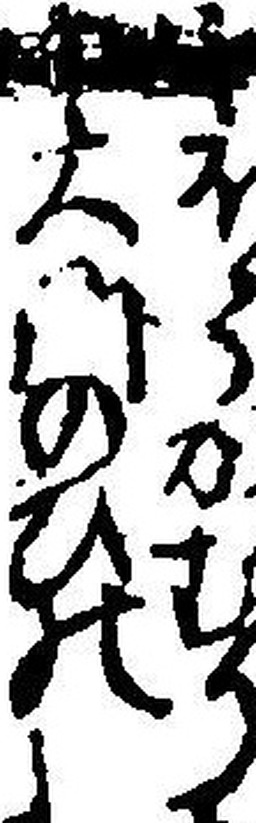大門のひの
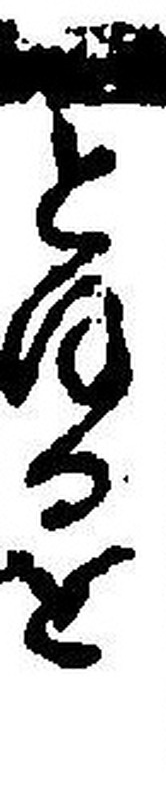とほるを
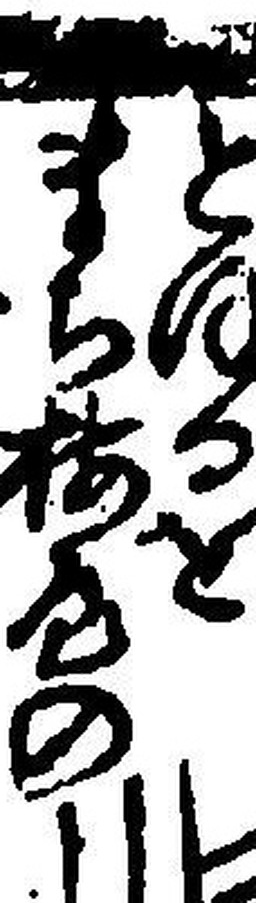まち梅屋の
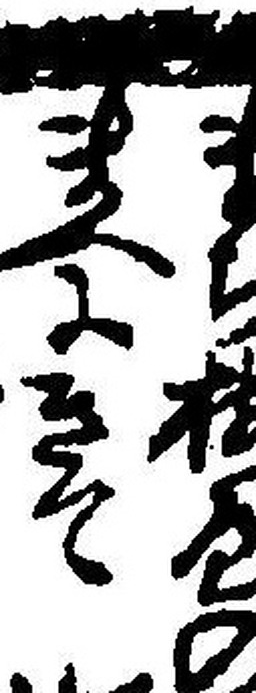まへにきて
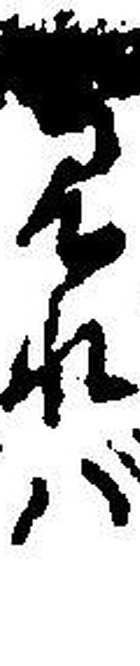見れば
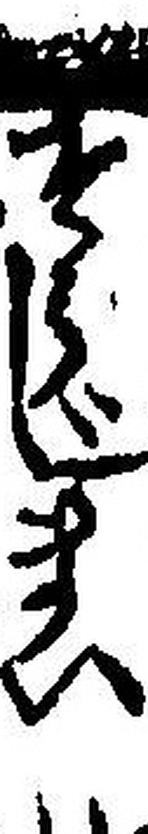そらじまい
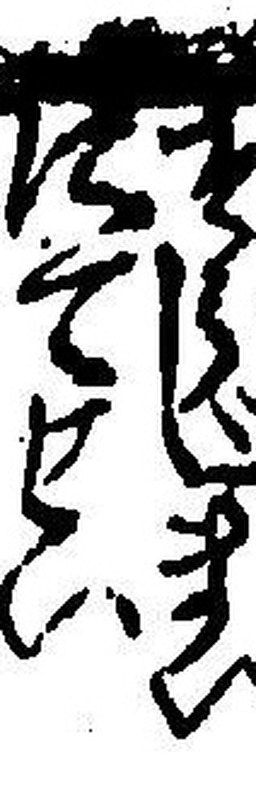にてせい
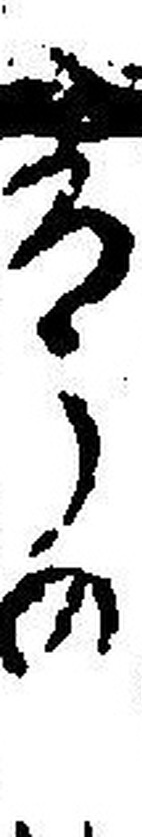ろうの
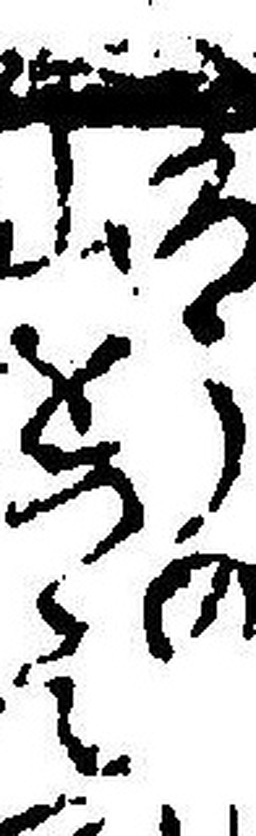山をつみ
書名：間違狐之女郎買 / 市場通笑作
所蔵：東京大学総合図書館 General Library in the University of Tokyo, JAPAN
